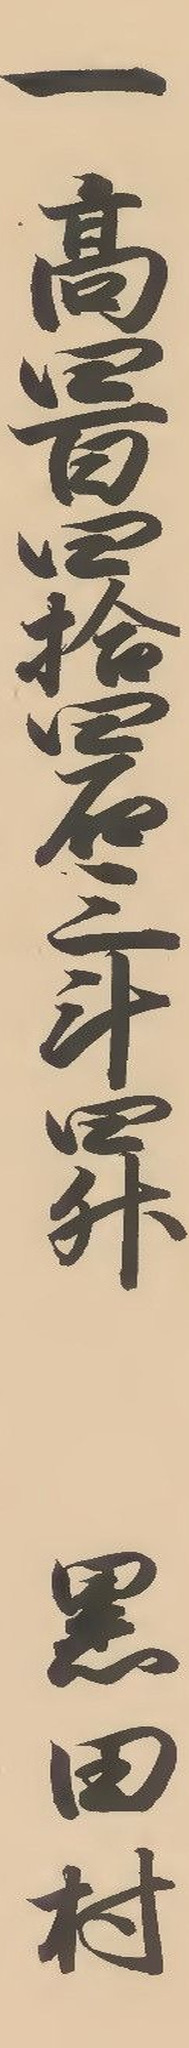一高四百四拾四石三斗四升黒田村
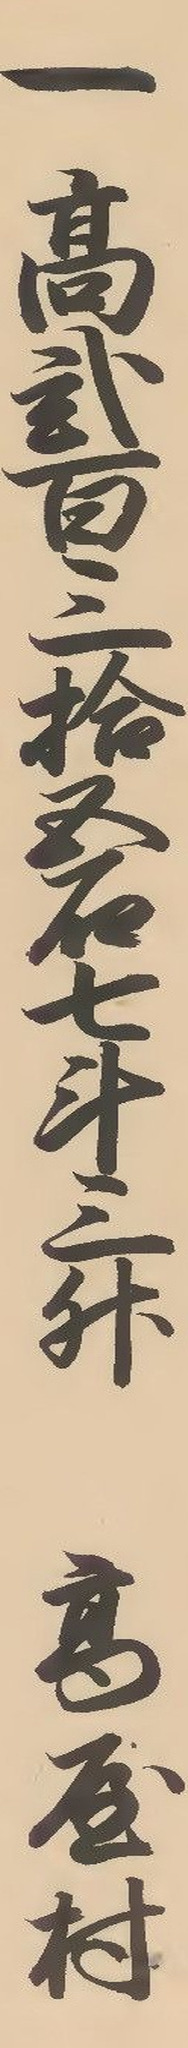一高弐百三拾五石七斗三升高屋村
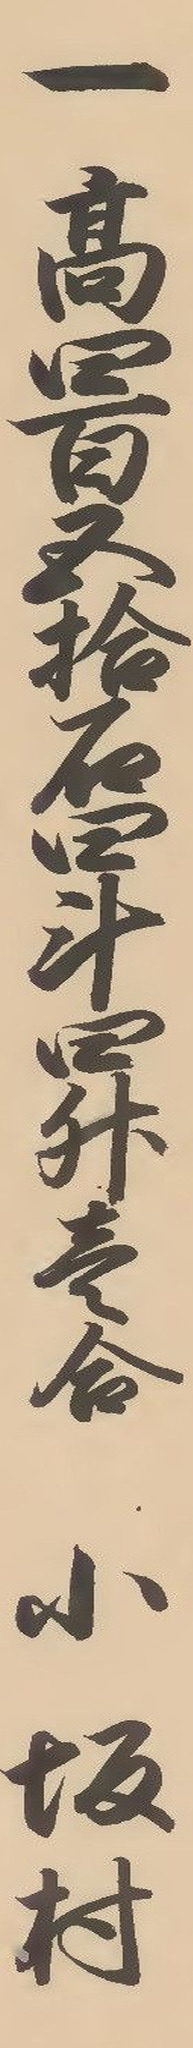一高四百五拾石四斗四升壱合小坂村
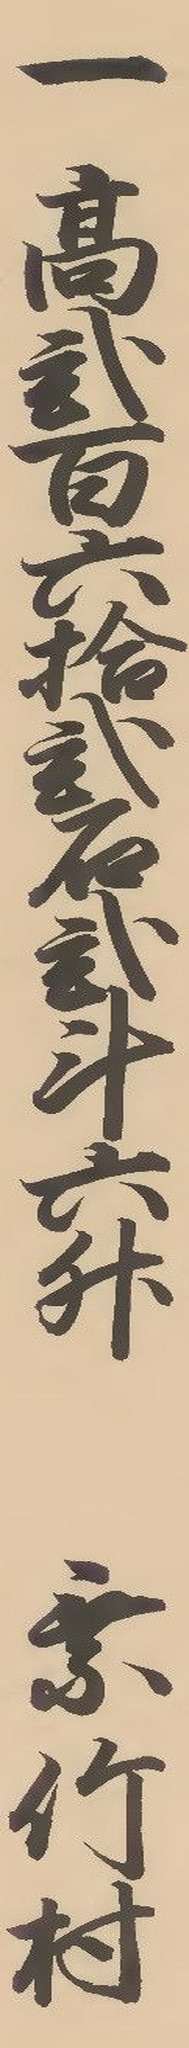一高弐百六拾弐石弐斗六升乗竹村
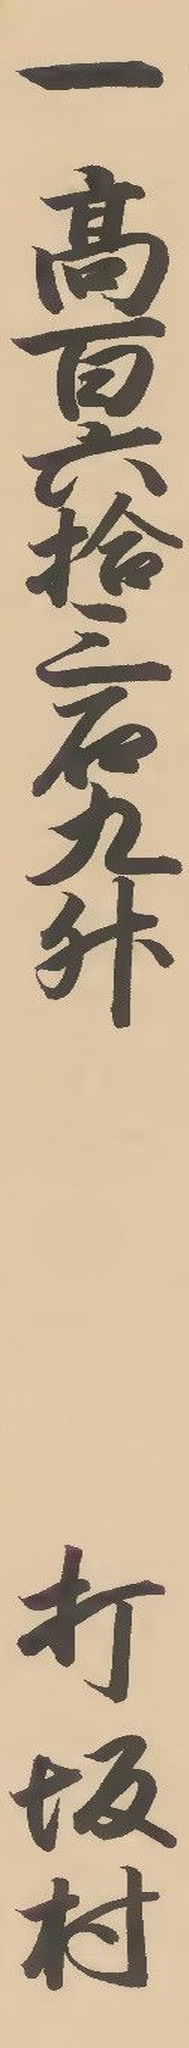一高百六拾三石九升打坂村

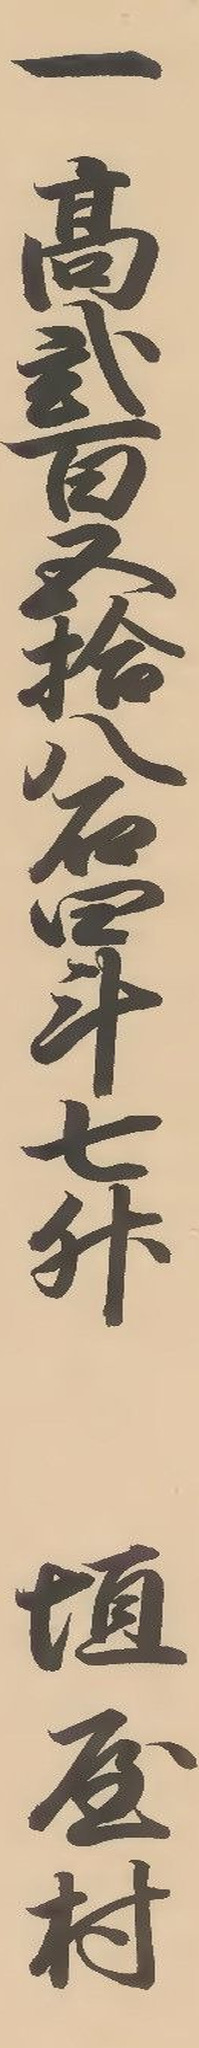一高弐百五拾八石四斗七升垣屋村
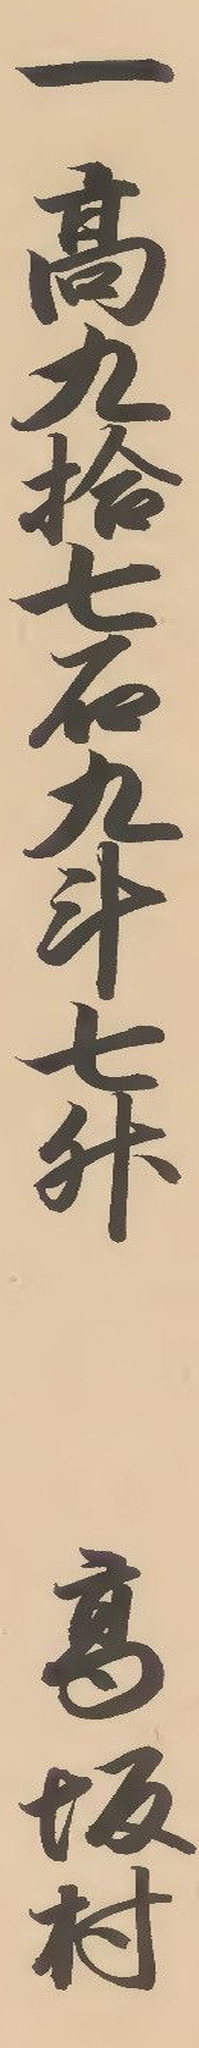一高九拾七石九斗七升高坂村
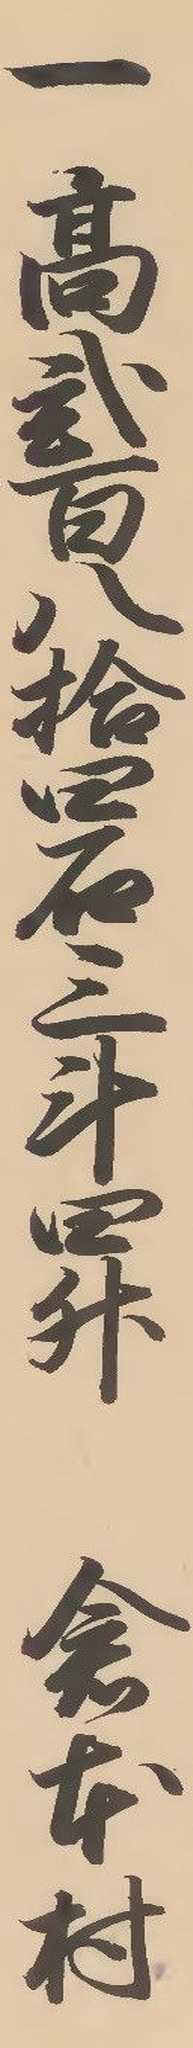一高弐百八拾四石三斗四升倉本村
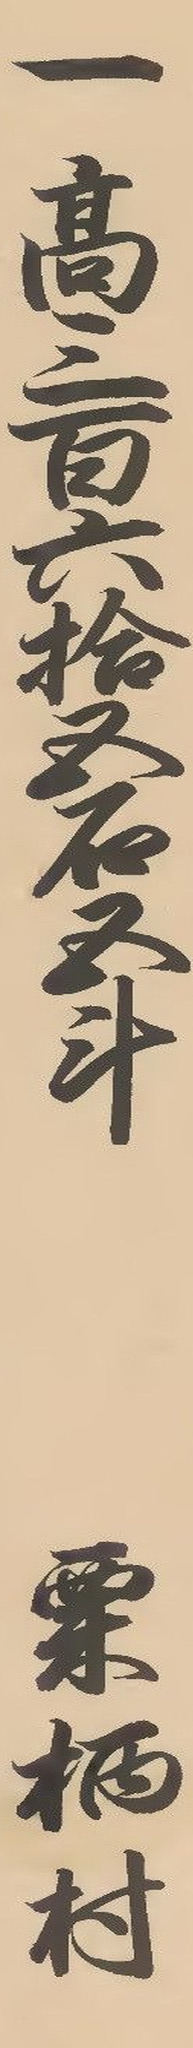一高三百六拾五石五斗栗栖村
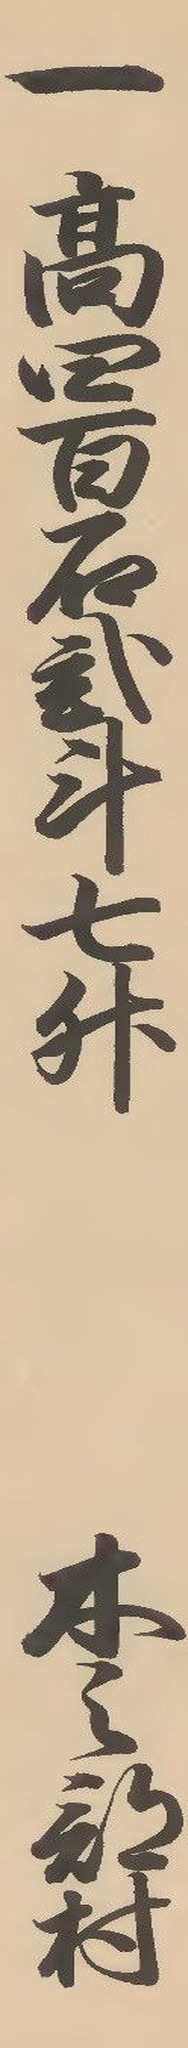一高四百石弐斗七升木之部村
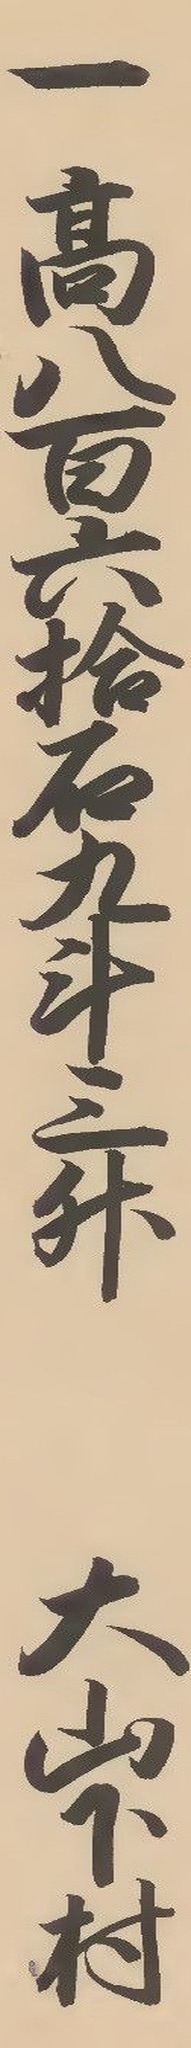一高八百六拾石九斗三升大山下村
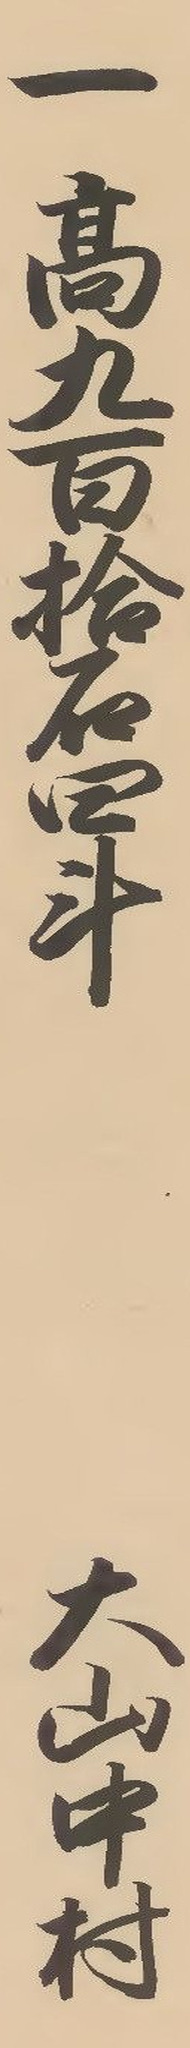一高九百拾石四斗大山中村
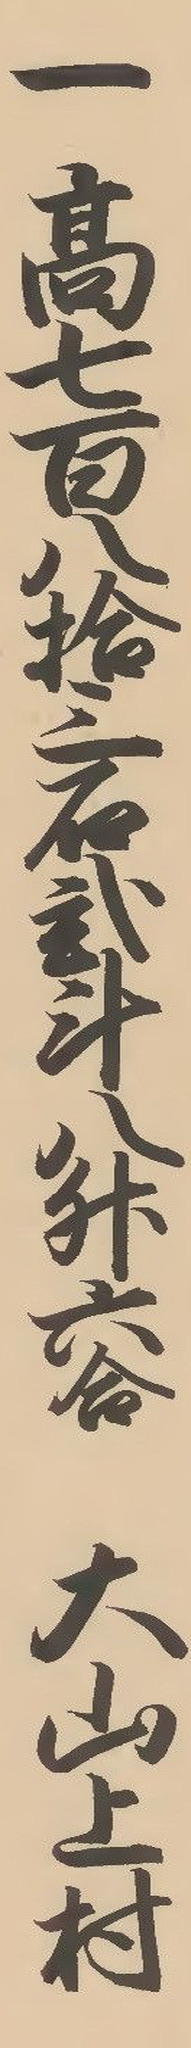一高七百八拾三石弐斗八升六合大山上村

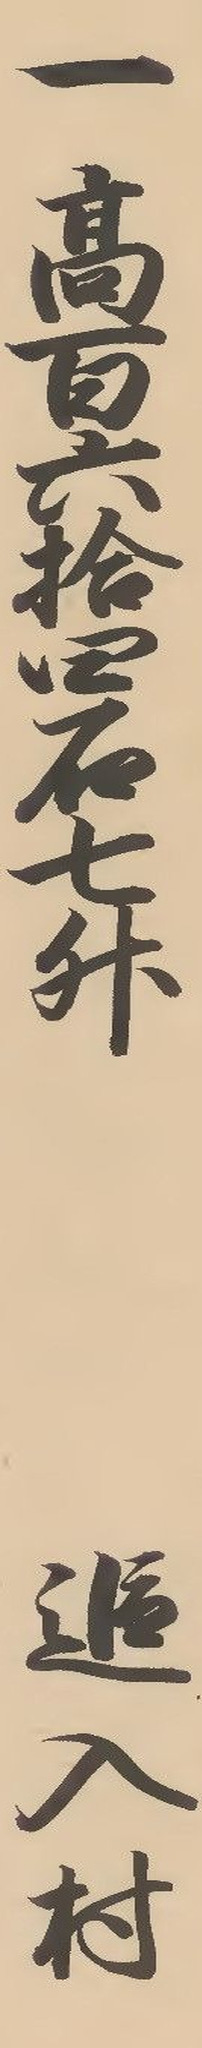一高百六拾四石七升追入村
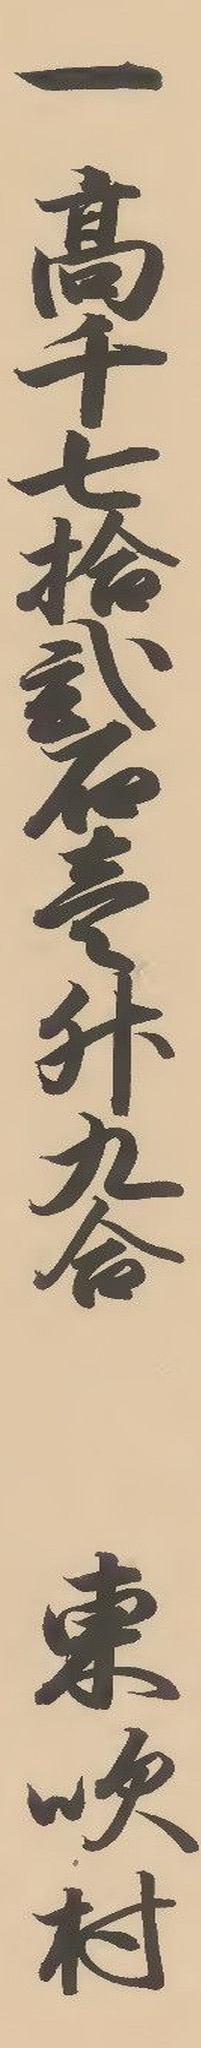一高千七拾弐石壱升九合東吹村
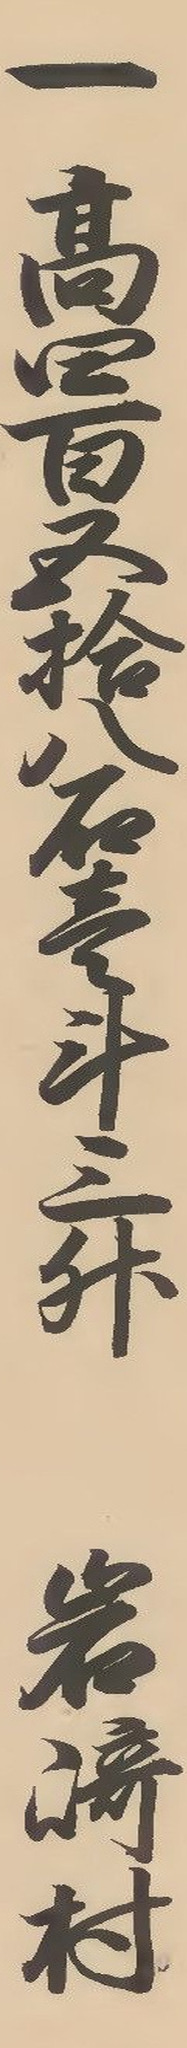一高四百五拾八石壱斗三升岩崎村
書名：丹波国郷帳
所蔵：国立公文書館 National Archives of Japan
